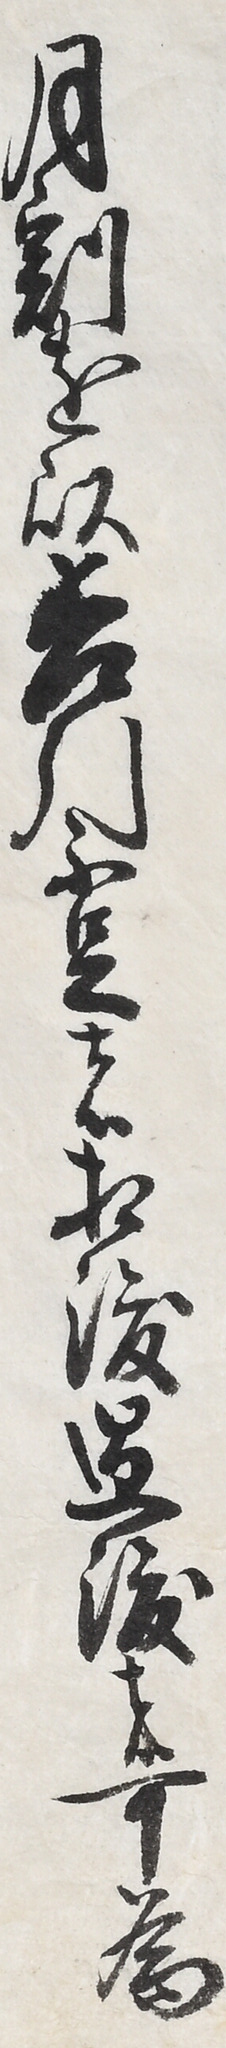月割を以差引不足は相渡過渡は可為
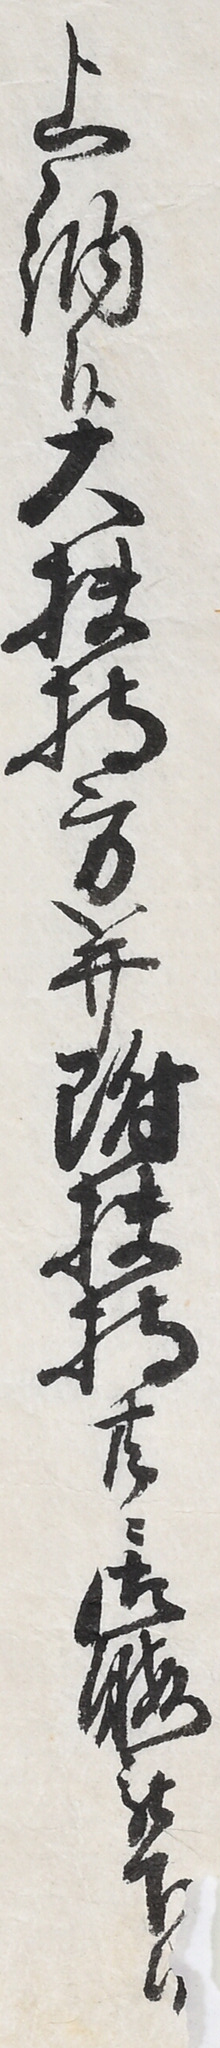上納候大扶持方并附扶持共ニ御聴被下候
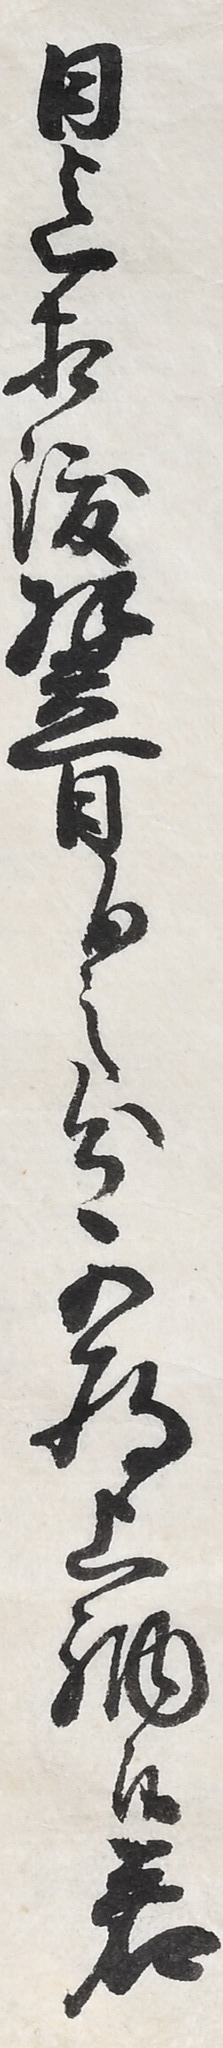日迄相渡翌日ゟ之分可為上納候若
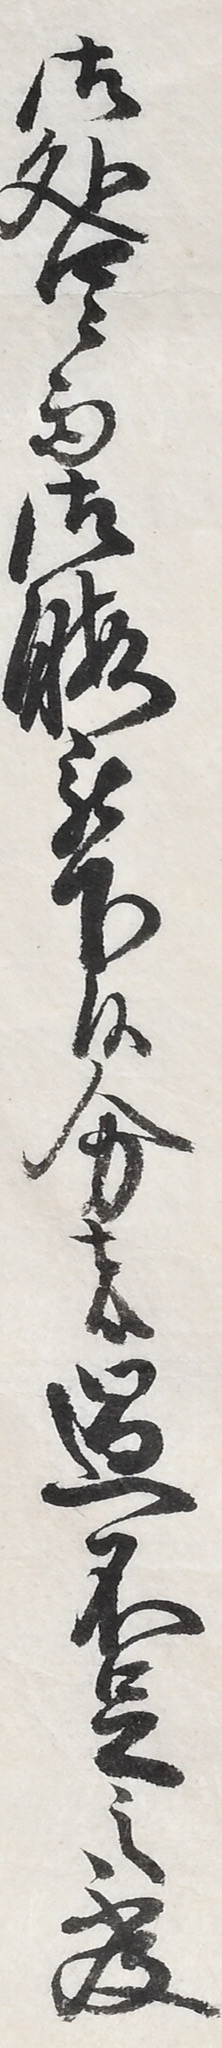御咎ニ而御聴被下候分は過不足之不及
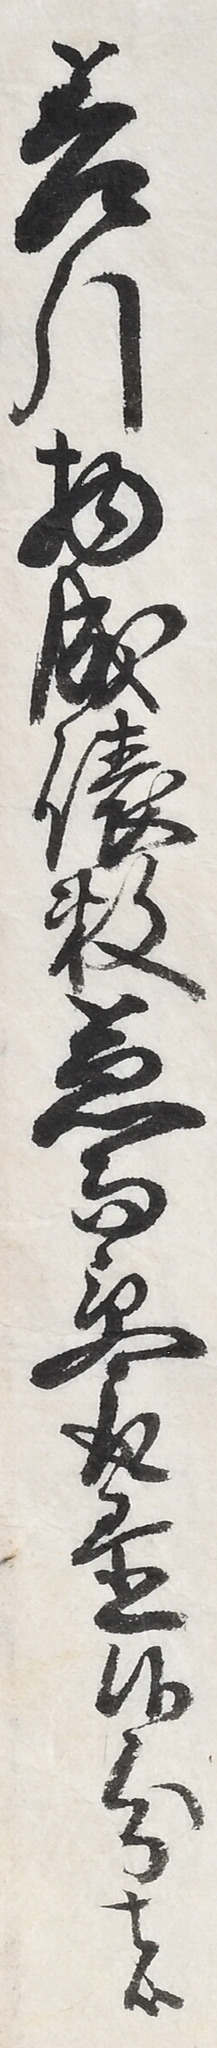差引物成俵数兼而受取置候分は
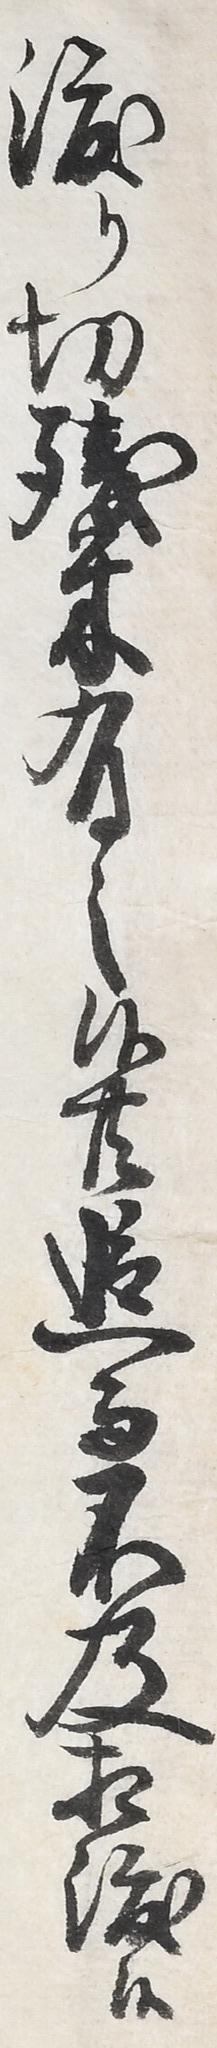渡リ切残米有之候共追而不及相渡候
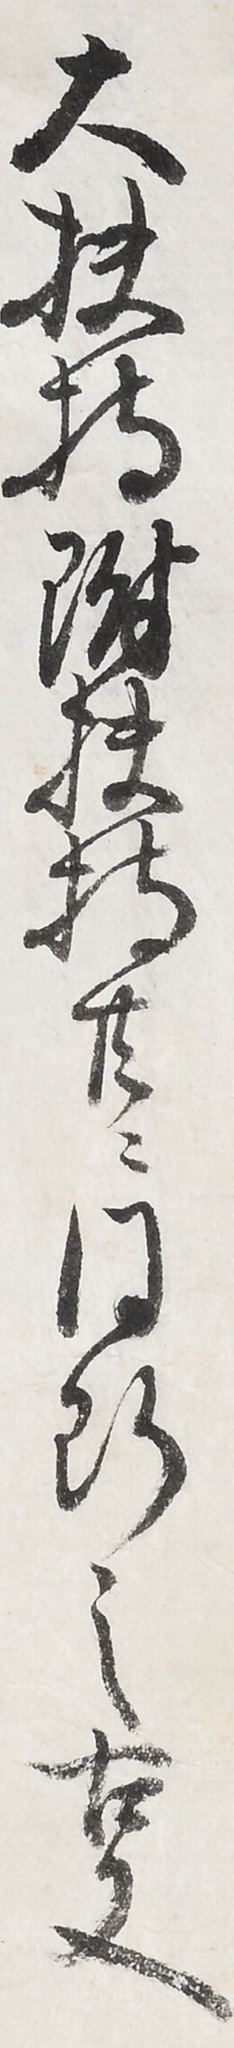大扶持附扶持共ニ同断之事
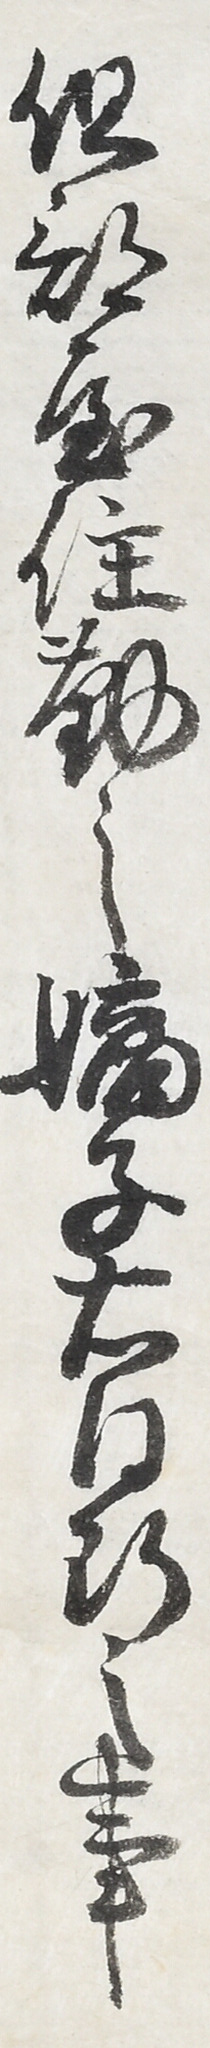但部屋勤之嫡子右同断之事
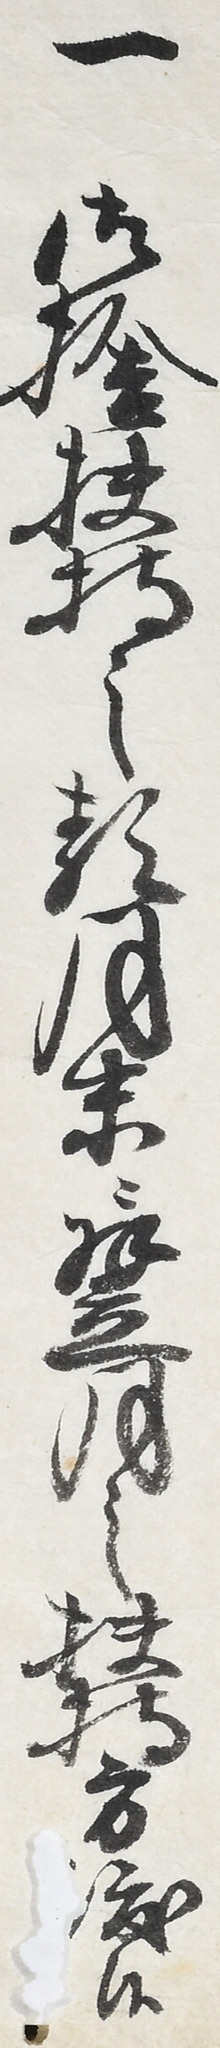一御捨扶持之類月末ニ翌月之扶持方渡候
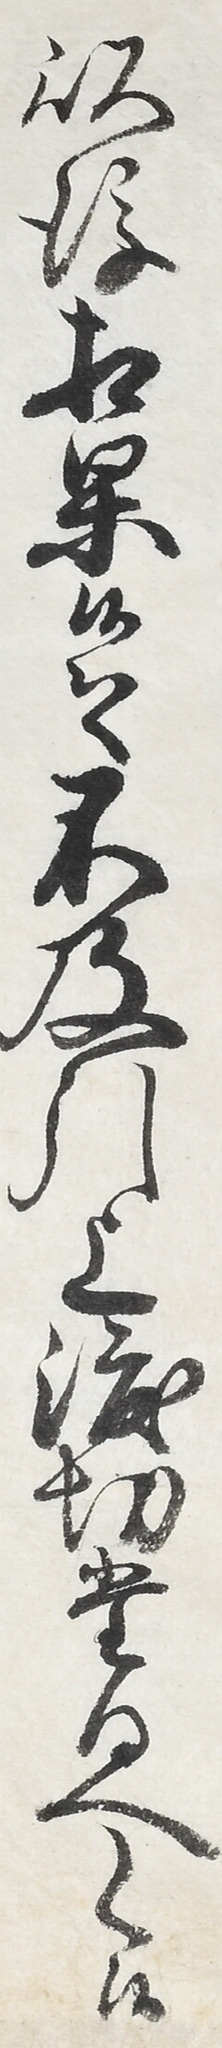以後相果候ハヽ不及引上渡切たるへく候
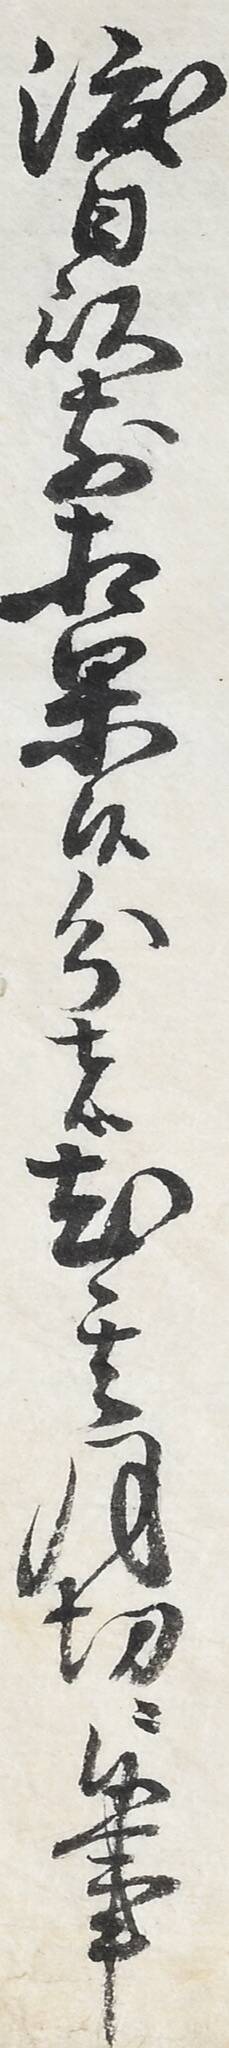後日以前相果候分は尤其月切ニ候事
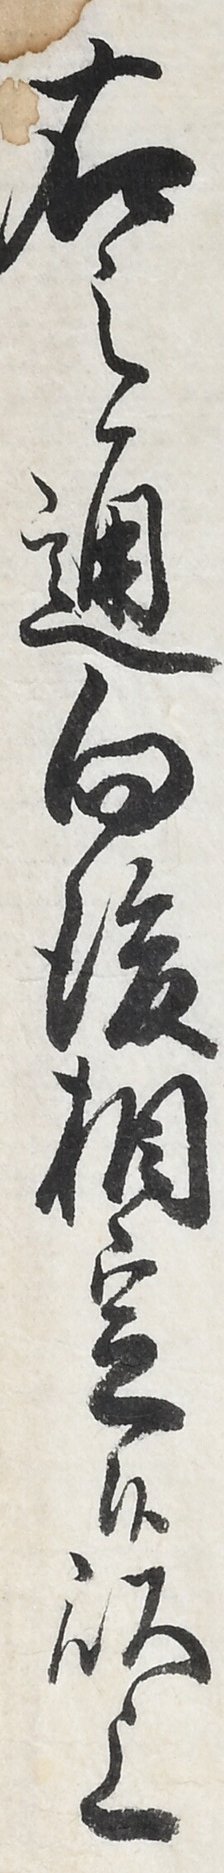右之通向後相定候以上

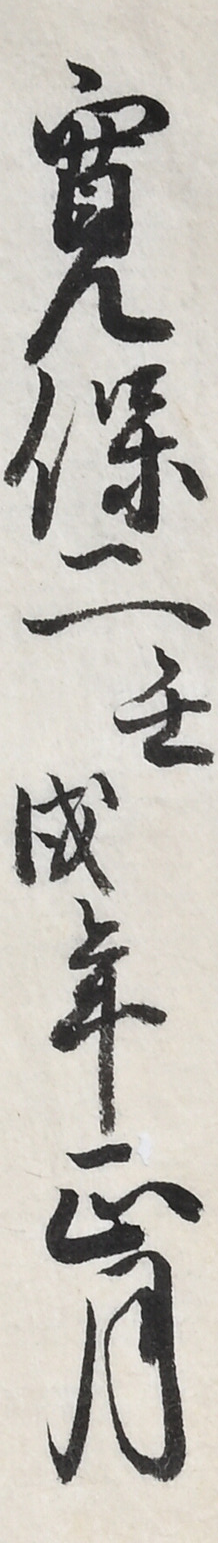寛保二壬戌年正月
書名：御給分渡方之定
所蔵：伊那市立高遠町図書館・合同会社AMANE
